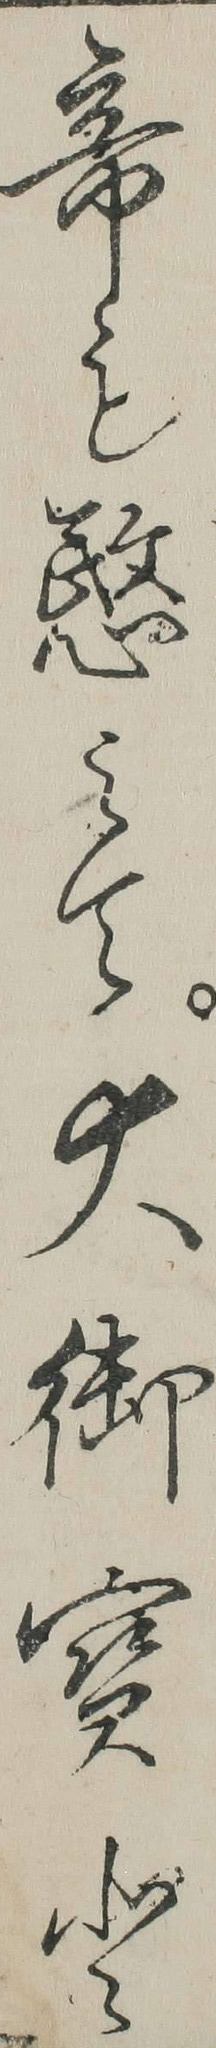帝も愍みて。大御宝と
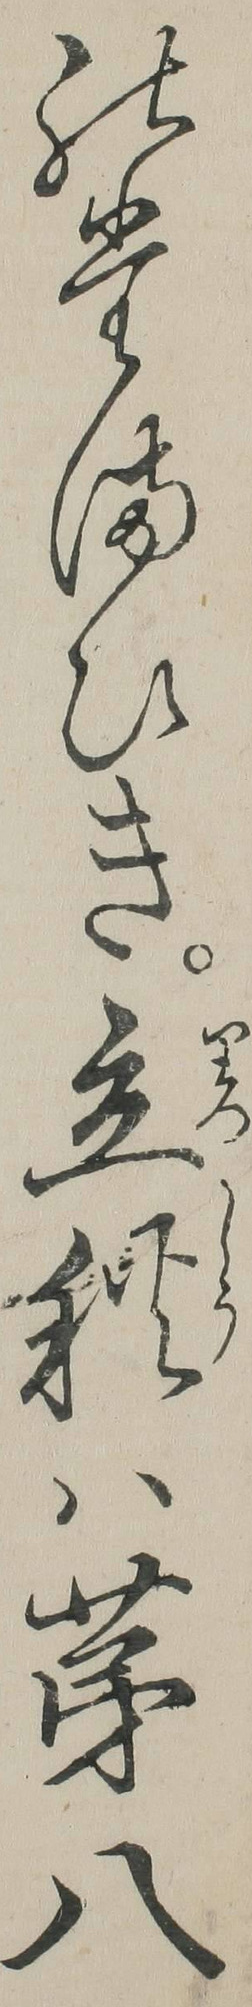のたまひき。立秋は第八
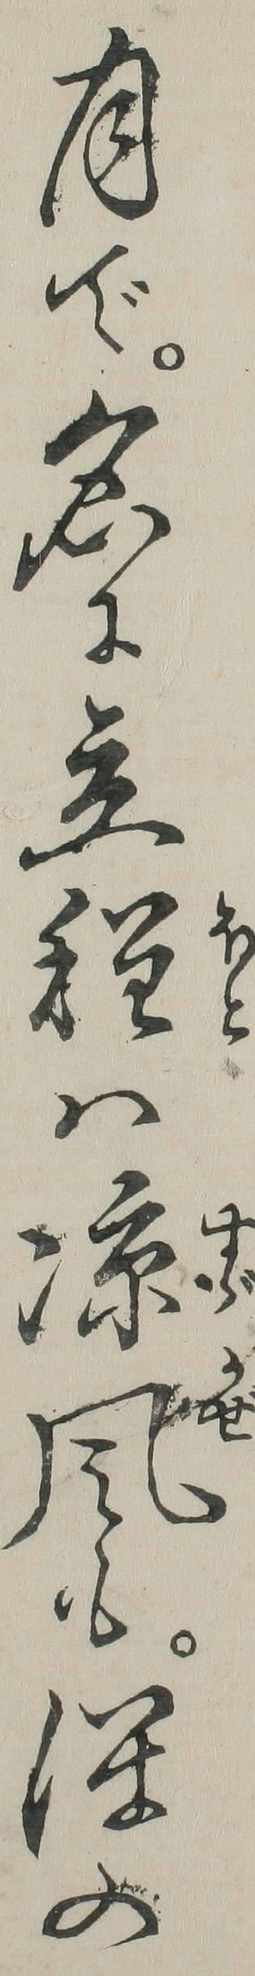月で。名に立程は凉風も。ほの
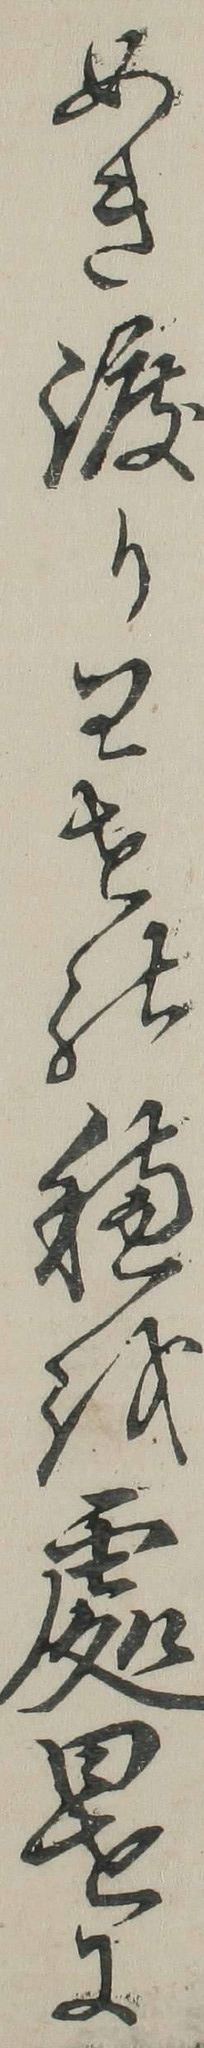めき渡りわせの穂を。処暑に
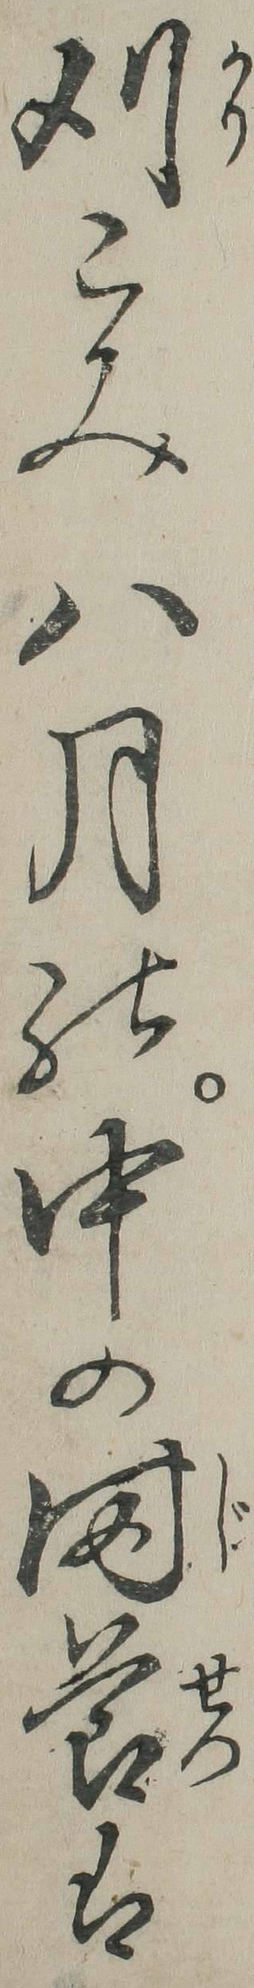刈こみ八月の。中の時節は

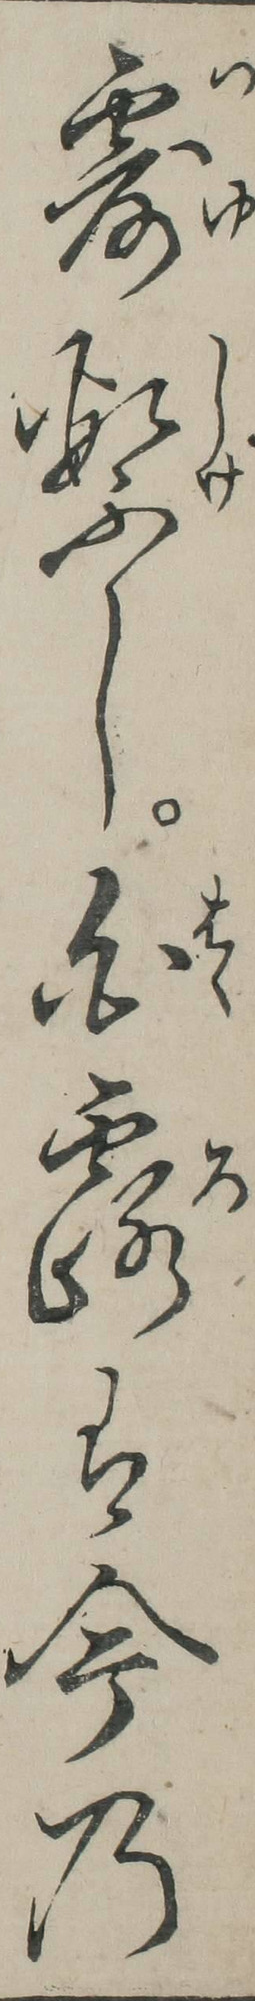露繁し。白露は今の
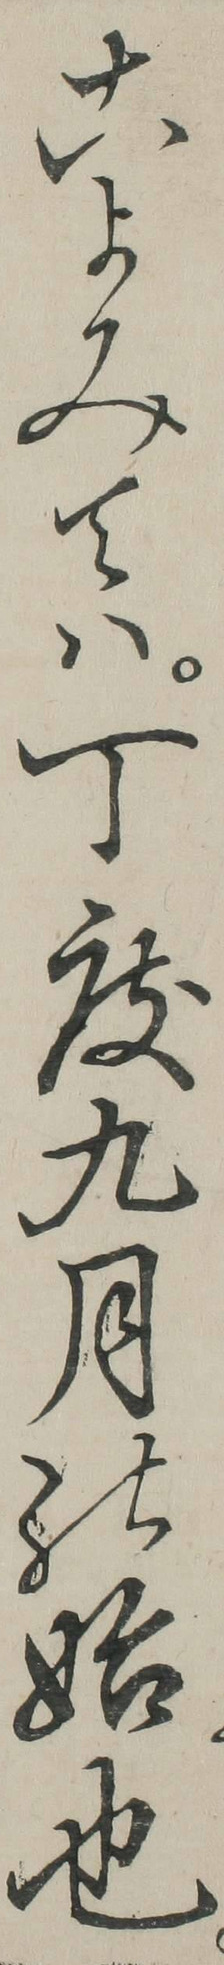こよみては。丁度九月の始也。
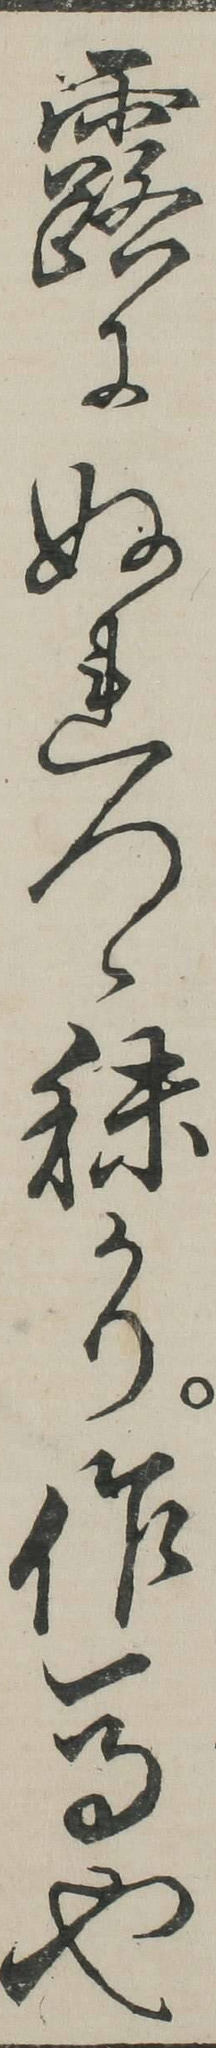露にぬれつゝ秣かり。作馬や
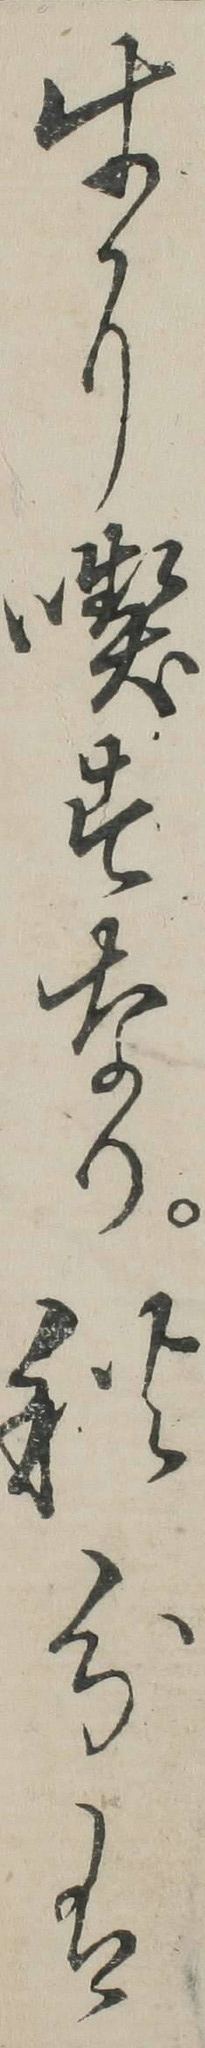牛に喫すなり。秋分は
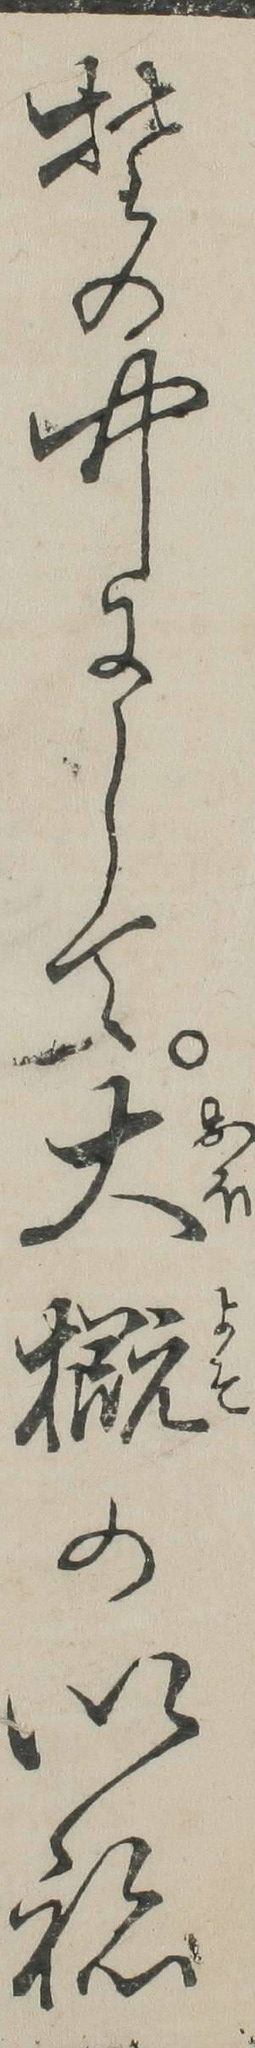その中にして。大概のいね
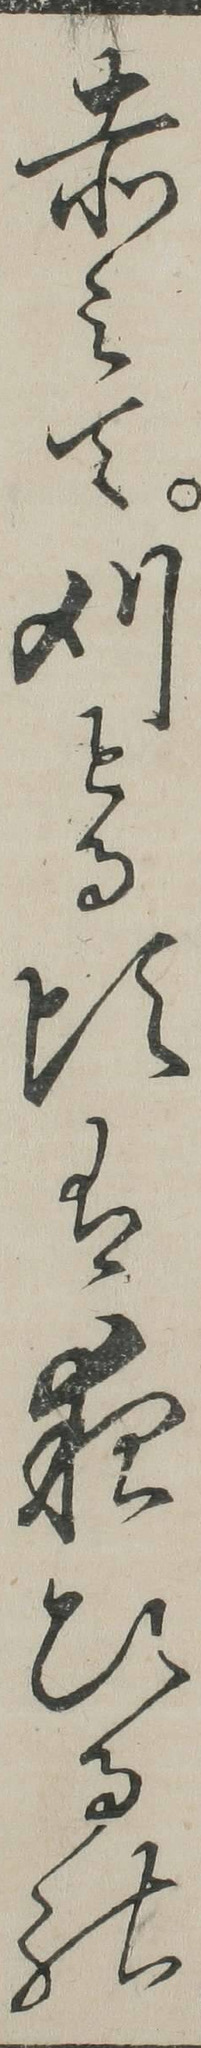赤みて。刈とる頃は夜ひるの。
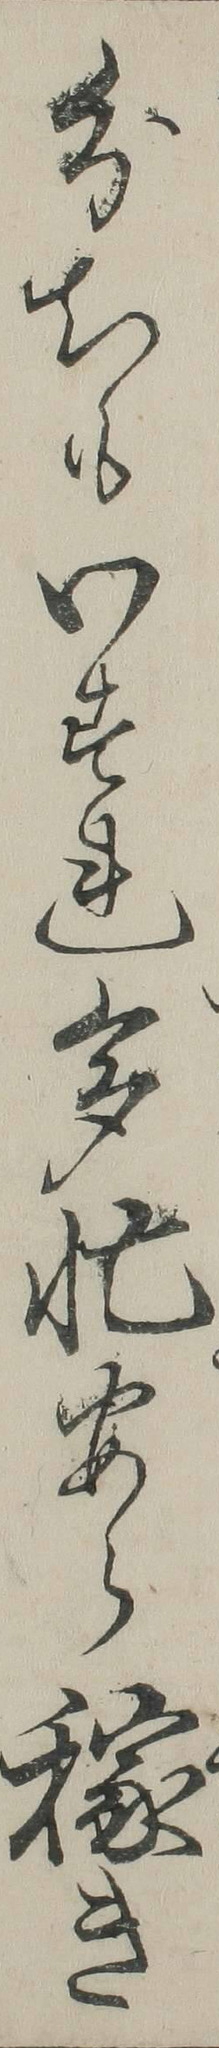分ちもわすれ多忙。あら稼き
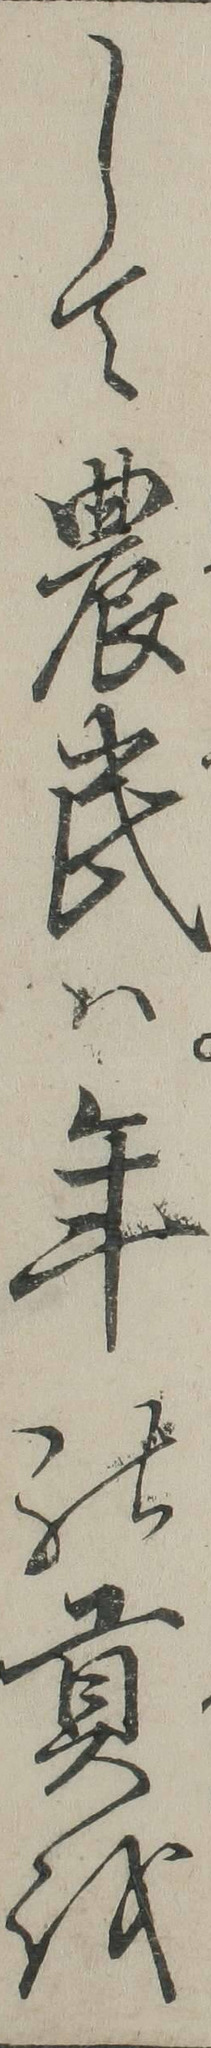して農民は。年の貢を

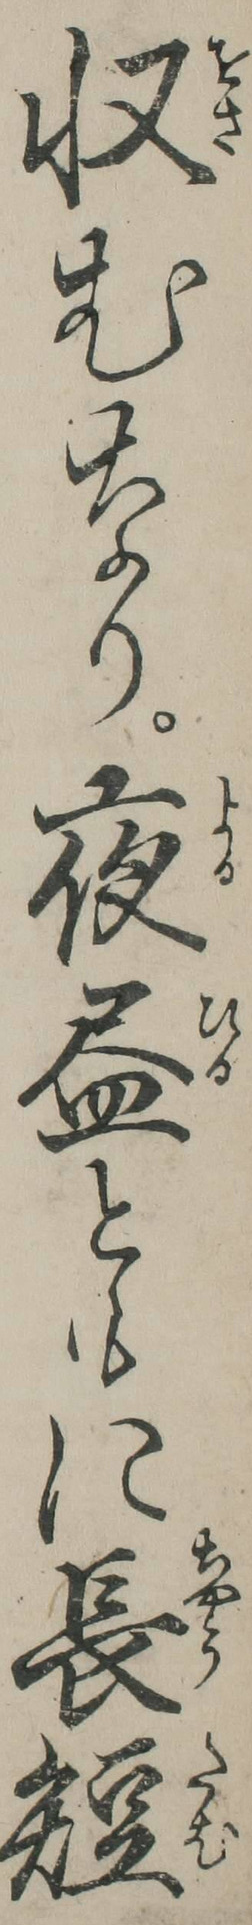収むなり。夜昼ともに長短
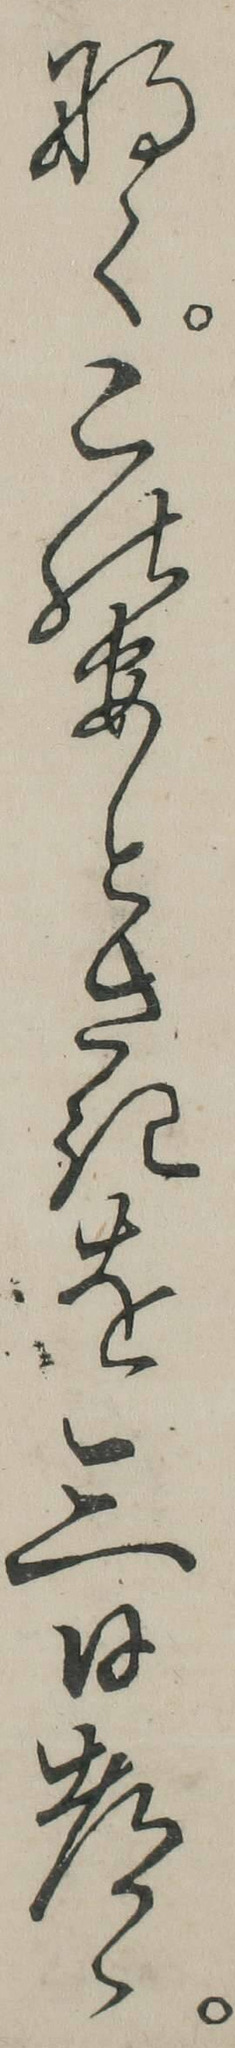なく。このあとさきを三日つゝ。
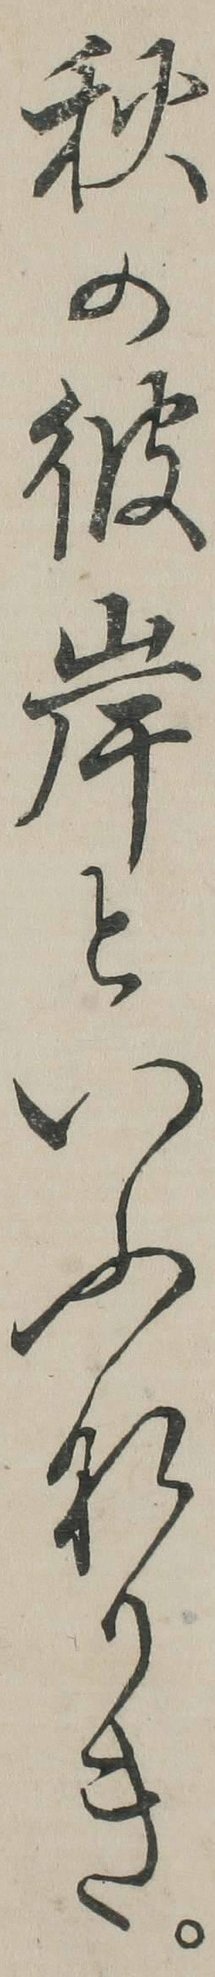秋の彼岸といふなりき。
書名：農蠶必要日読往来
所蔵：東京学芸大学附属図書館 国文学研究資料館
